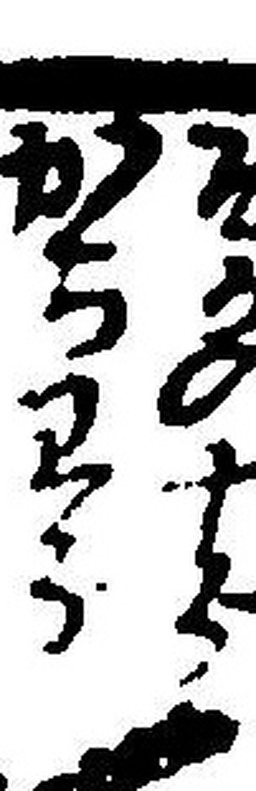かちわら
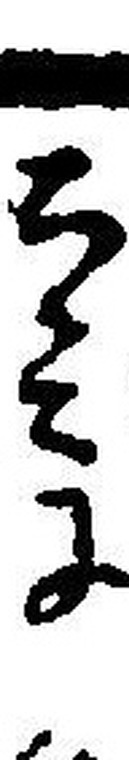こみに

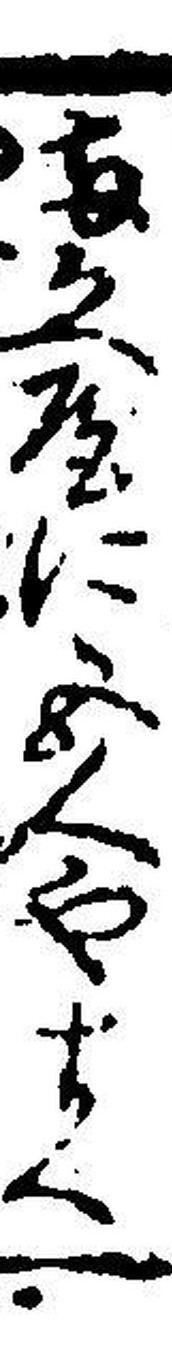両かへ屋に五人や十人
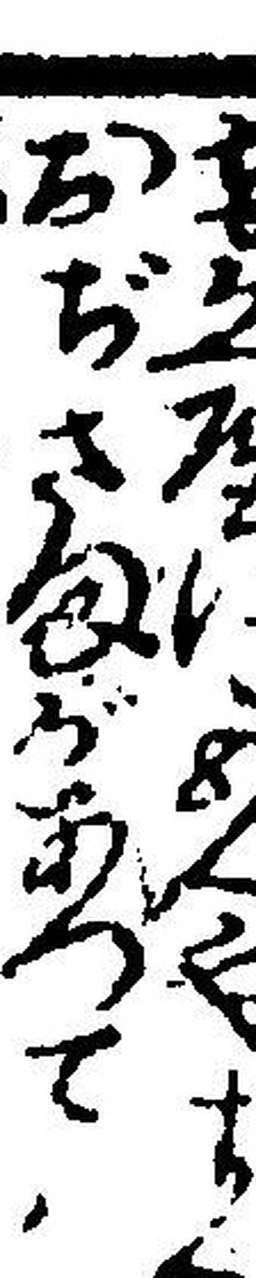おぢさまがあつて
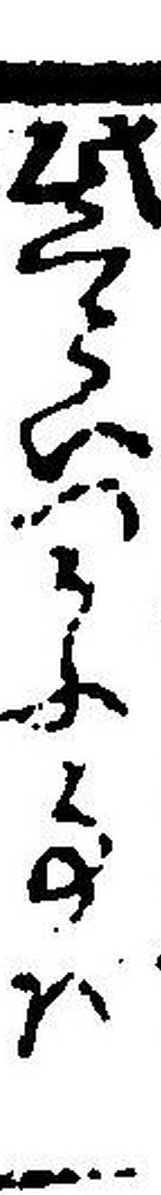此くらいつかふ事は
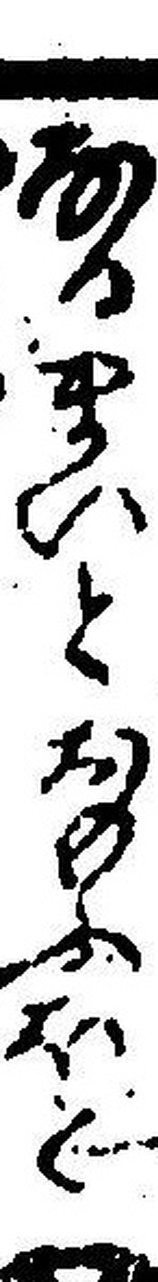なるまいとおもふほと
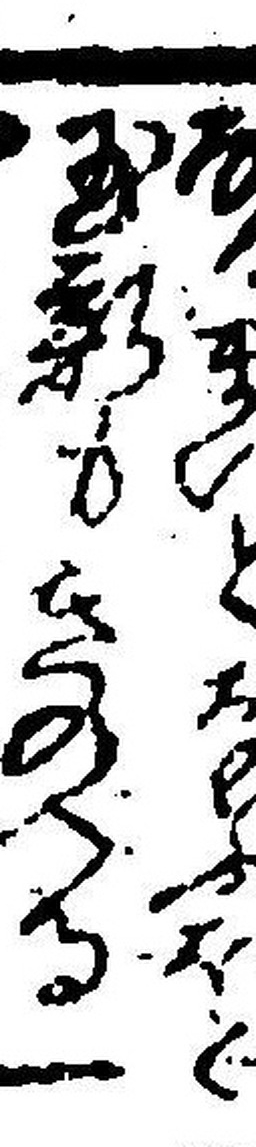玉新もきのへる
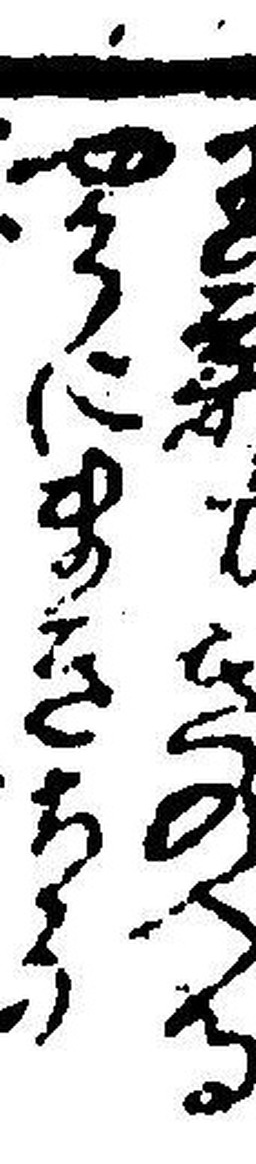やうにまきちら
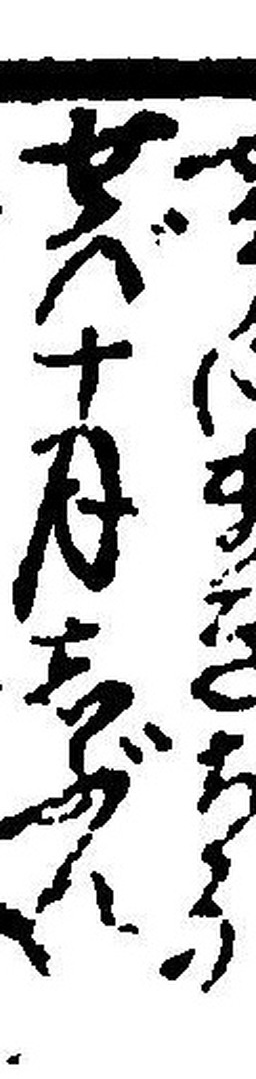せば十月しぶん
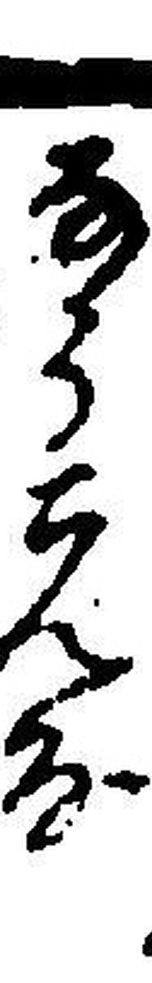ならこんな
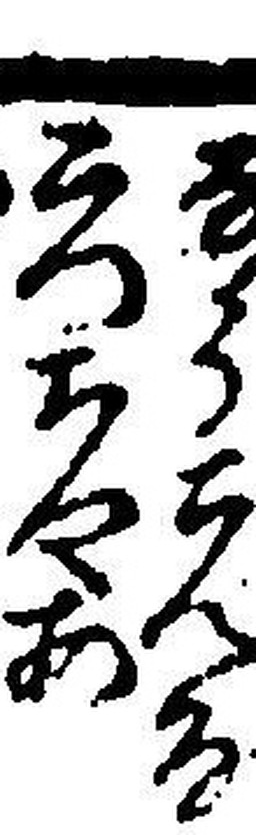こつちやあ
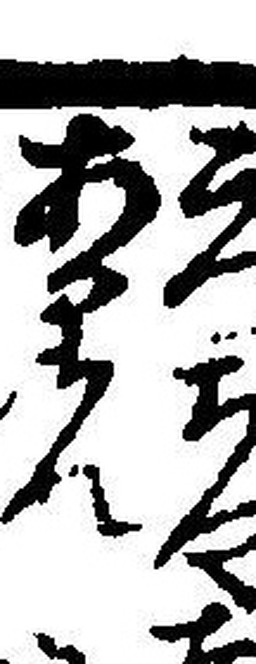ありん
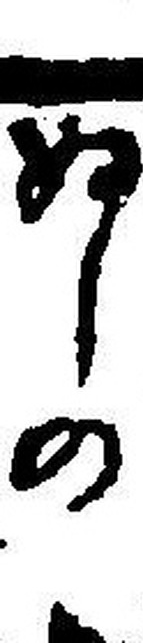ぬしの
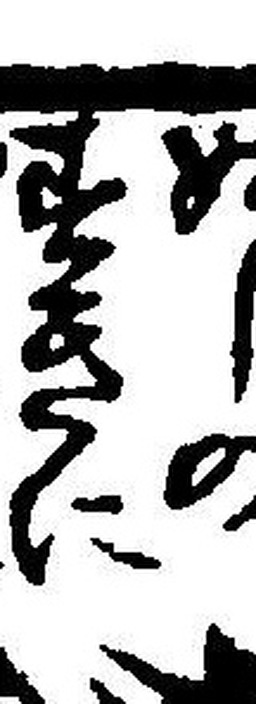すきに
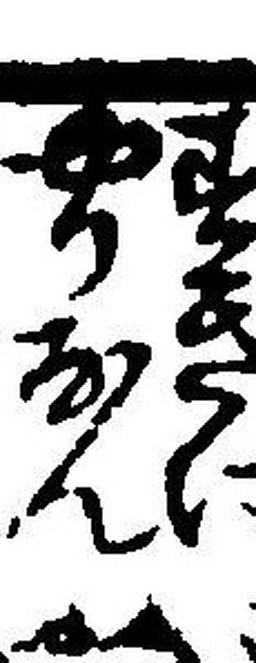やりなん
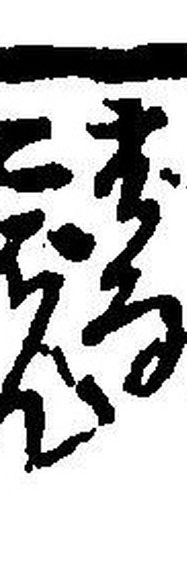こばん
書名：間違狐之女郎買 / 市場通笑作
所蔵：東京大学総合図書館 General Library in the University of Tokyo, JAPAN
